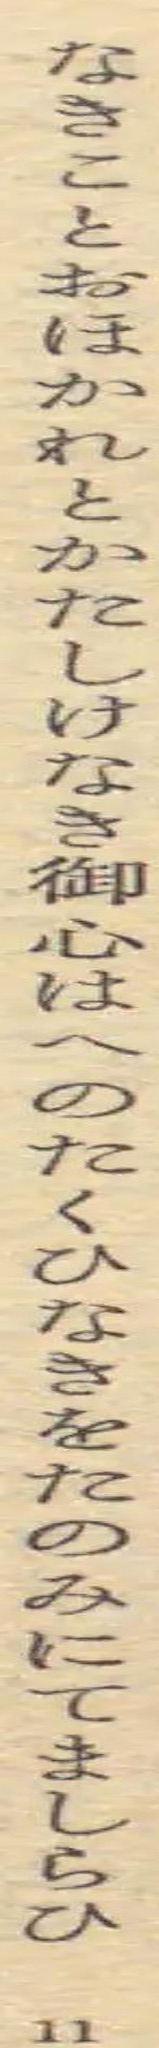なきことおほかれとかたしけなき御心はへのたくひなきをたのみにてましらひ
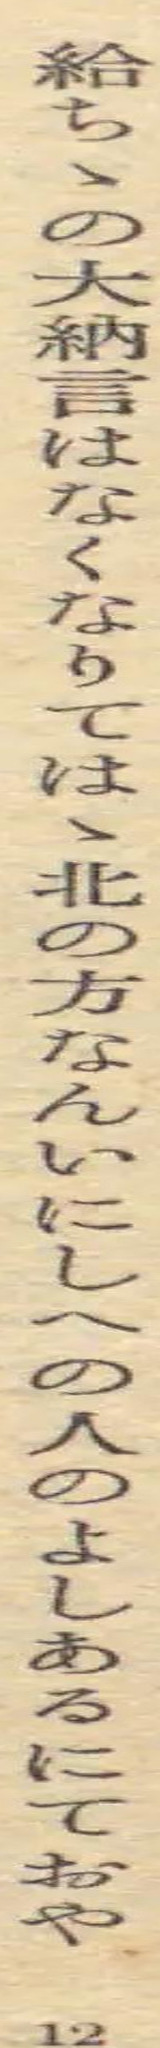給ちゝの大納言はなくなりてはゝ北の方なんいにしへの人のよしあるにておや
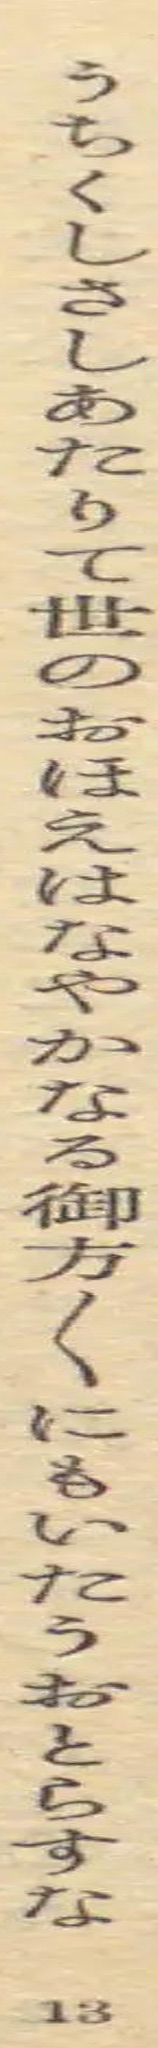うちくしきしあたりて世のおほえはなやかなる御方〳〵にもいたうおとらすな
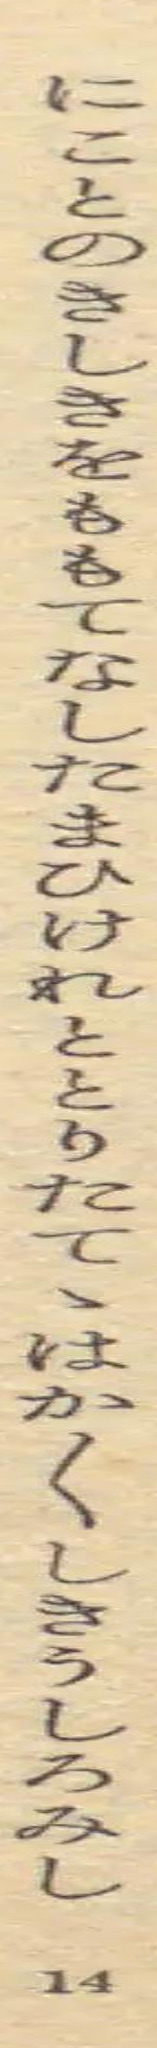にことのきしきをももてなしたまひけれととりたてゝはか〳〵しきうしろみし
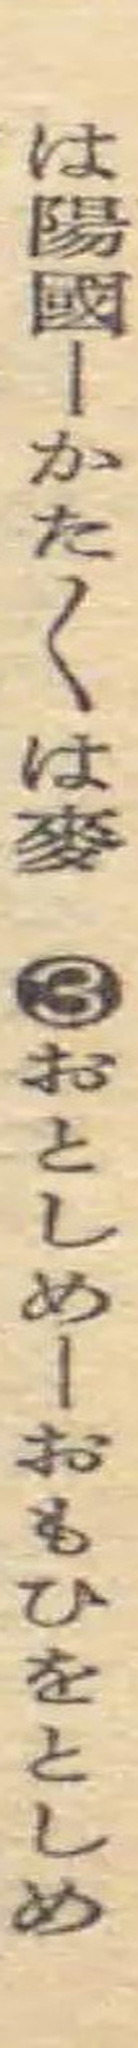は陽国―かた〳〵は麦❸おとしめ―おもひをとしめ
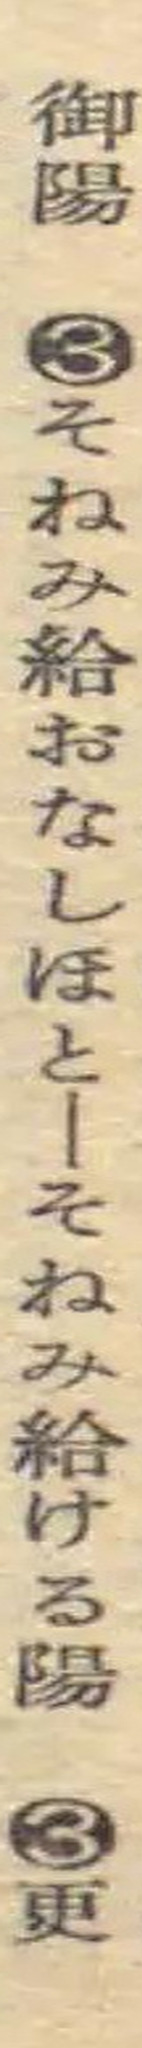御陽❸そねみ給おなしほと―そねみ給ける陽❸更
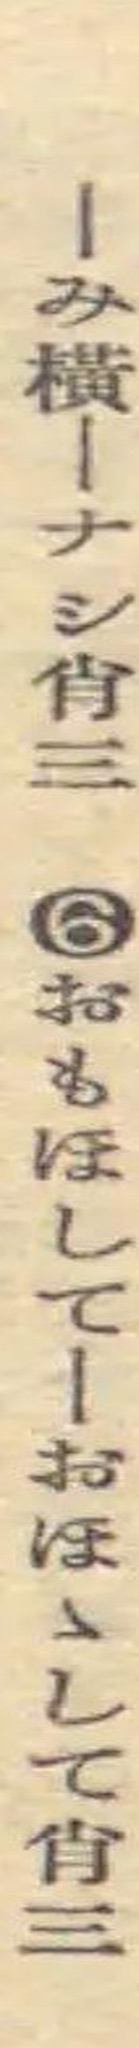―み横―ナシ肖三❻おもほして―おほゝして肖三
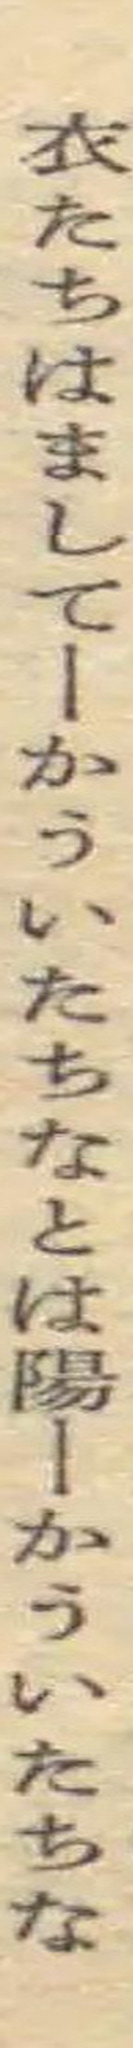衣たちはまして―かういたちなとは陽―かういたちな
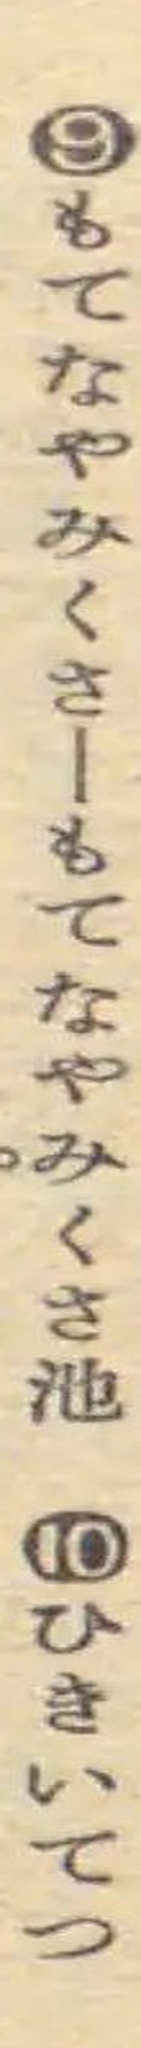❾もてなやみくさ―もてなやみくさ池❿ひきいてつ
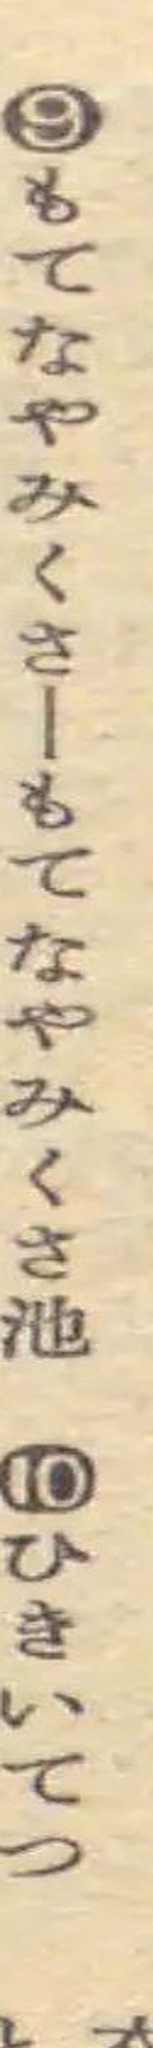❾もてなやみくさ―もてなやみくさ池❿ひきいてつ
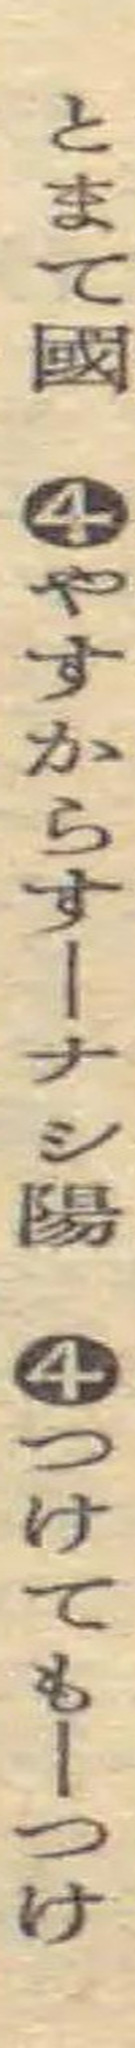とまて国❹やすからす―ナシ陽❹つけても―つけ
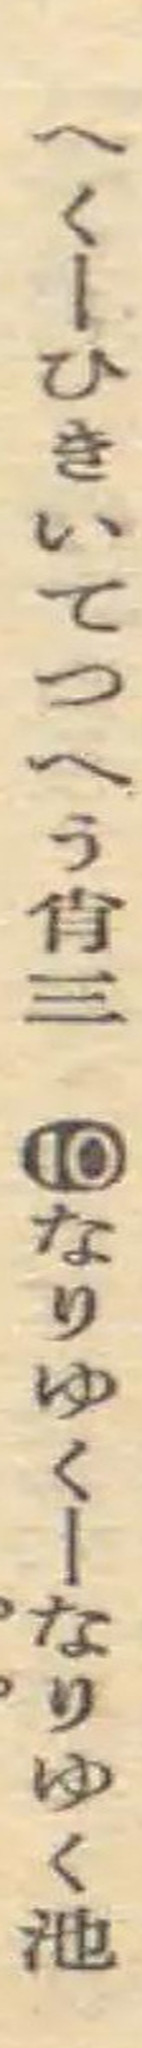へく―ひきいてつへう肖三❿なりゆく―なりゆく池
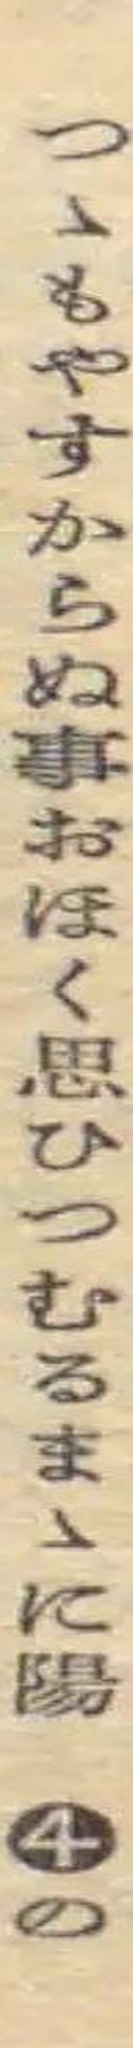つゝもやすからぬ事おほく思ひつむるまゝに陽❹の
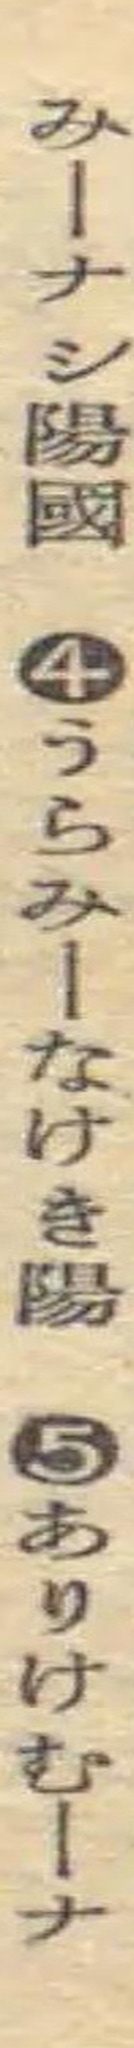み―ナシ陽國❹うらみ―なけき陽❺ありけむ―ナ
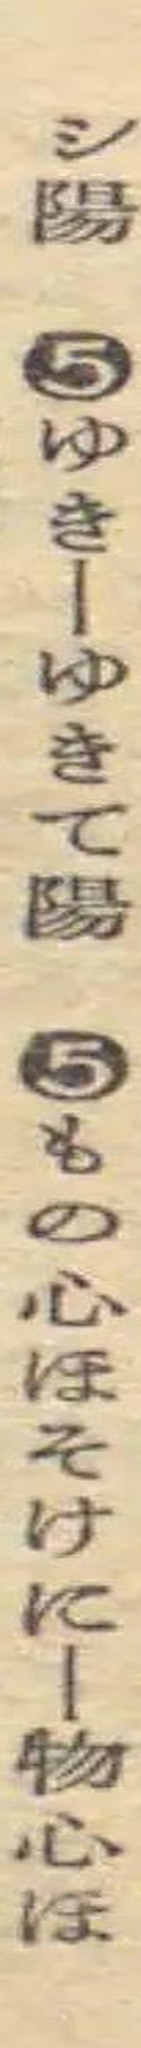シ陽❺ゆき―ゆきて陽❺もの心ほそけに―物心ほ
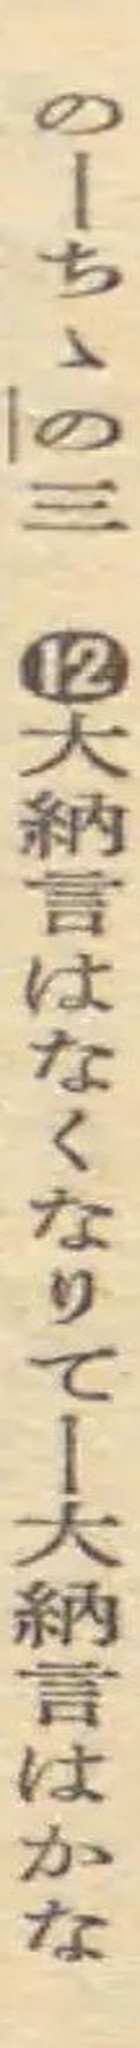の―ちゝの──三⓬大納言はなくりて―大納言はかな
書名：校異源氏物語.
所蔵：国立国会図書館 National Diet Library, JAPAN
